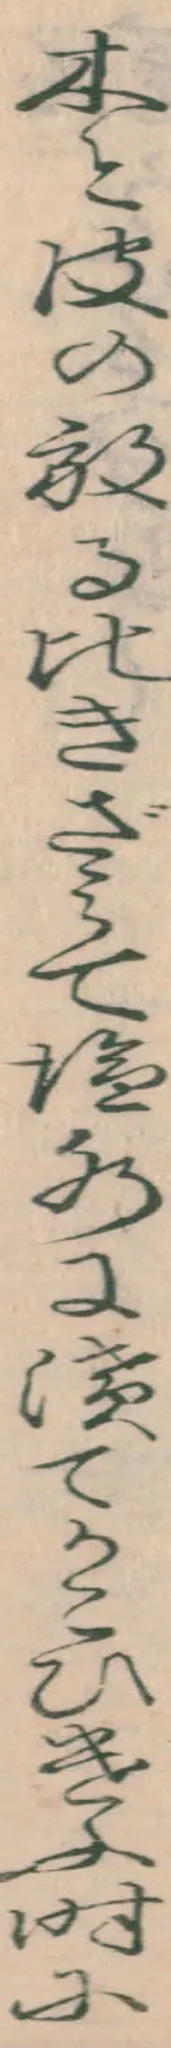木と皮の放る比きざみて塩水に漬てかこひ遣ふ時に
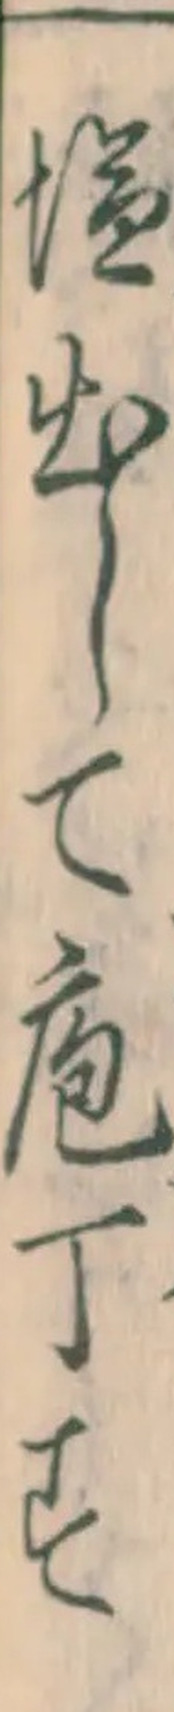塩出して庖丁す
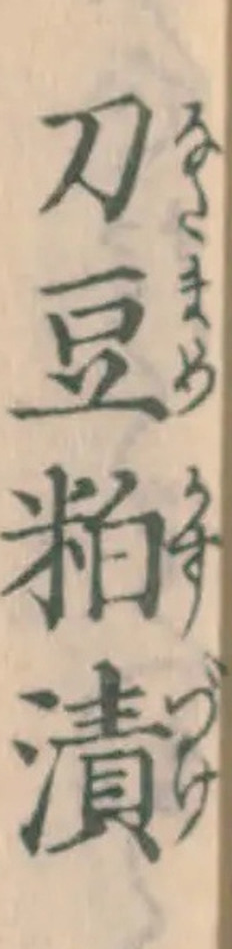刀豆粕漬
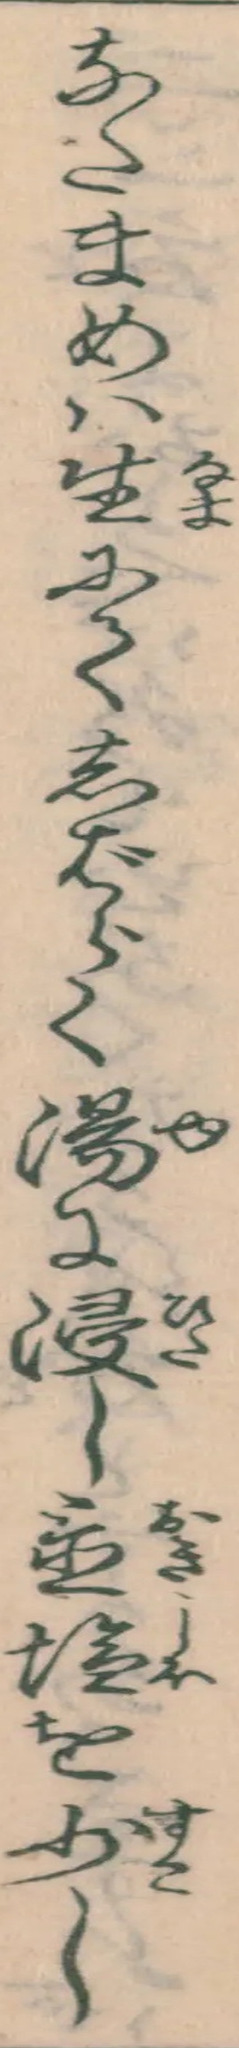なたまめは生にてしばらく湯に浸し置塩を少し
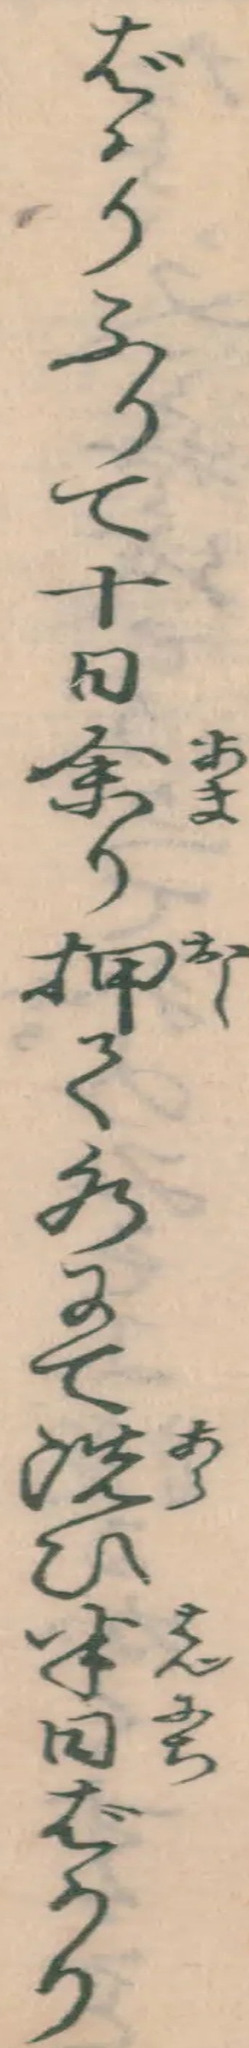ばかりふりて十日余り押て水にて洗ひ半日ばかり
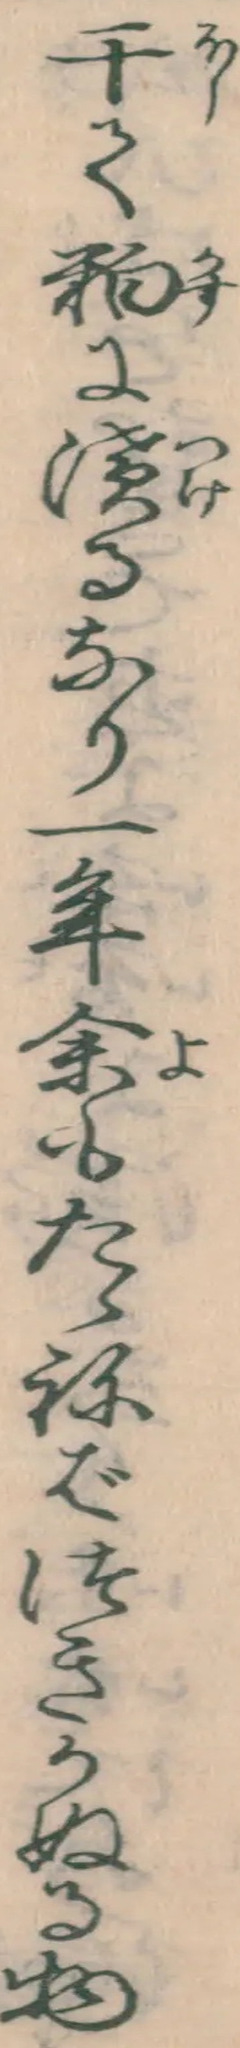干て粕に漬るなり一年余もたゝねばつきかぬる物
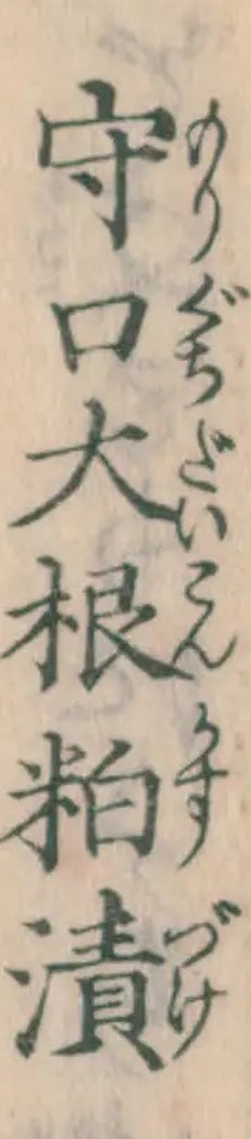守口大根粕漬
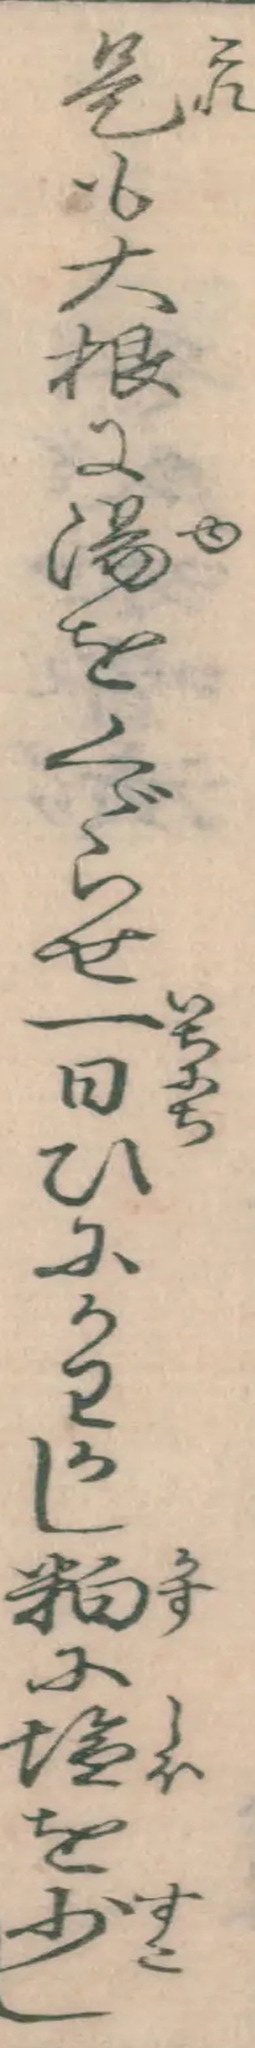是も大根に湯をくゞらせ一日ひにかわかし粕に塩を少し
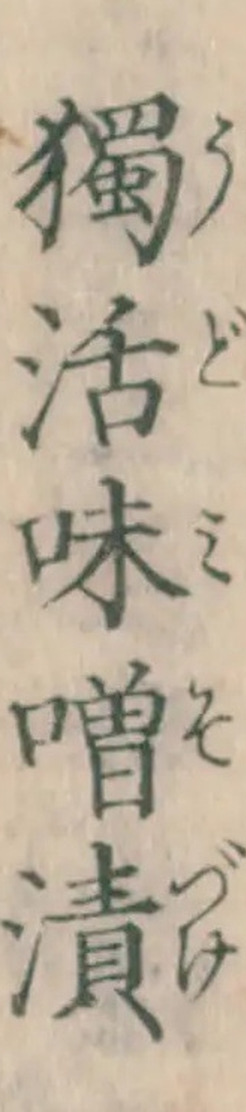独活味噌漬

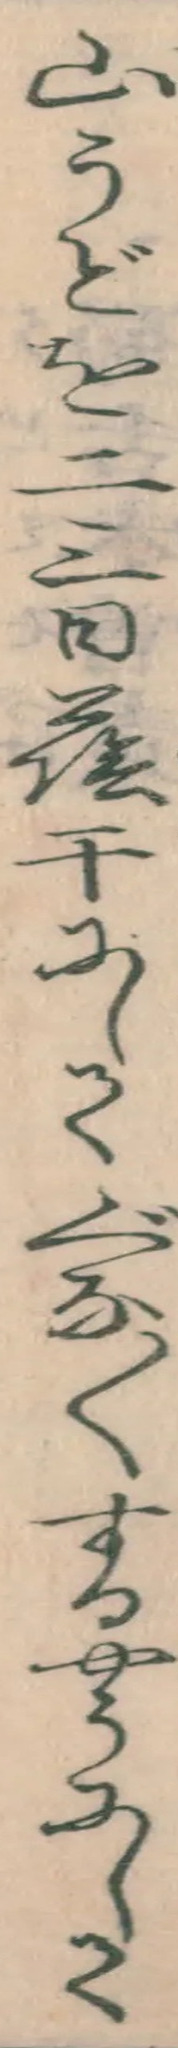山うどを二三日蔭干にしてぐな〳〵するやうにして
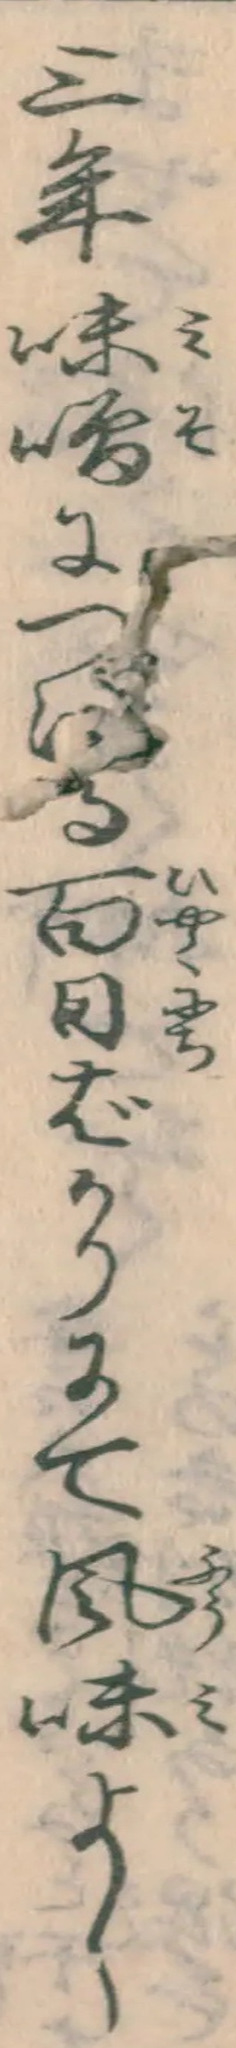三年味噌につける百日ばかりにて風味よし
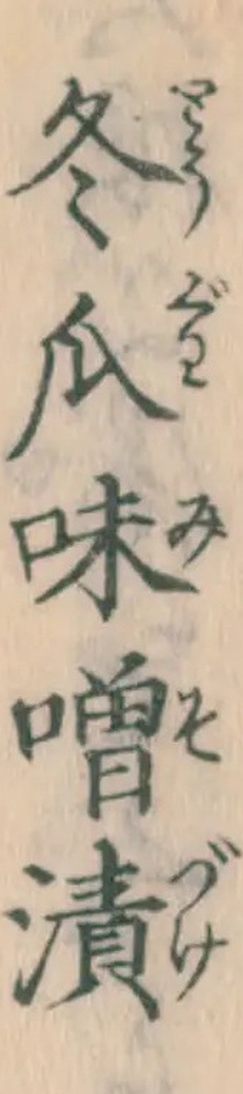冬瓜味噌漬
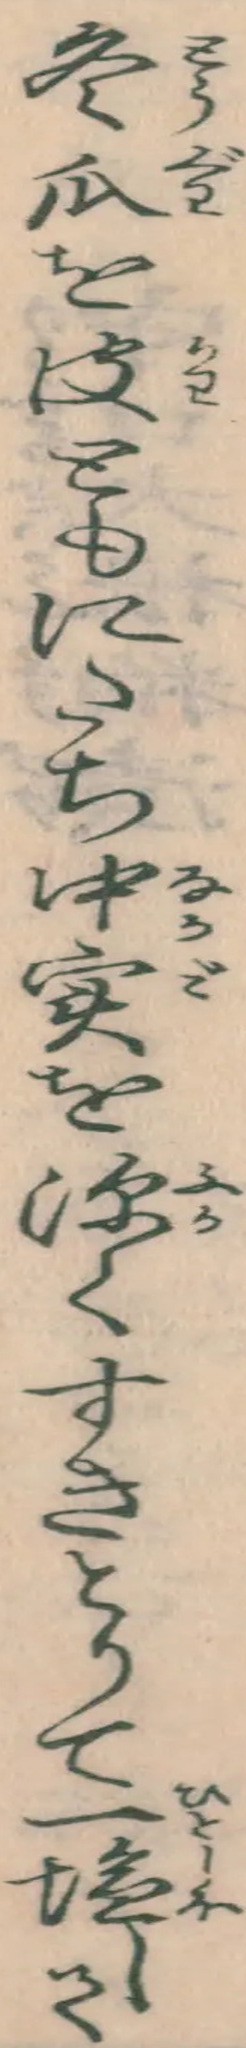冬瓜を皮ともにたち中実を深くすきとりて一塩して
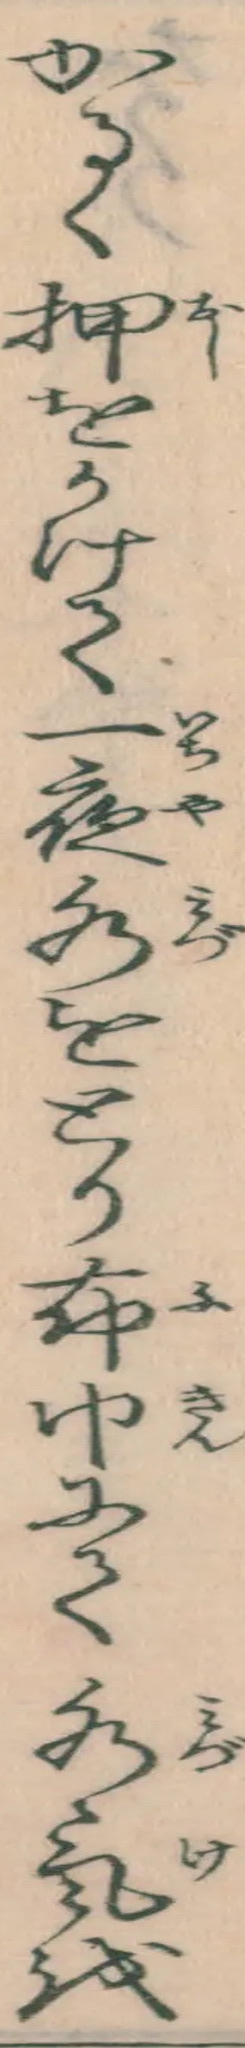かるく押をかけて一夜水をとり布巾にて水気を
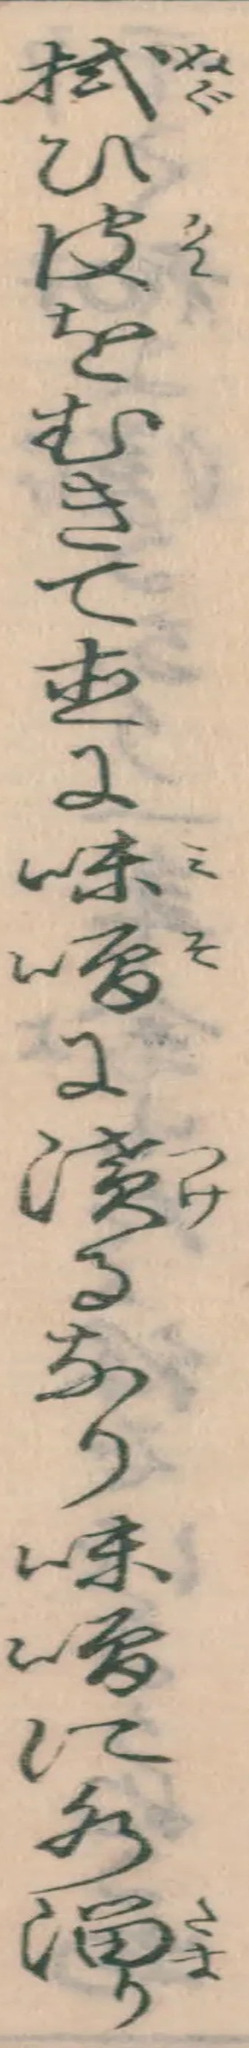拭ひ皮をむきて直に味噌に漬るなり味噌に水溜り
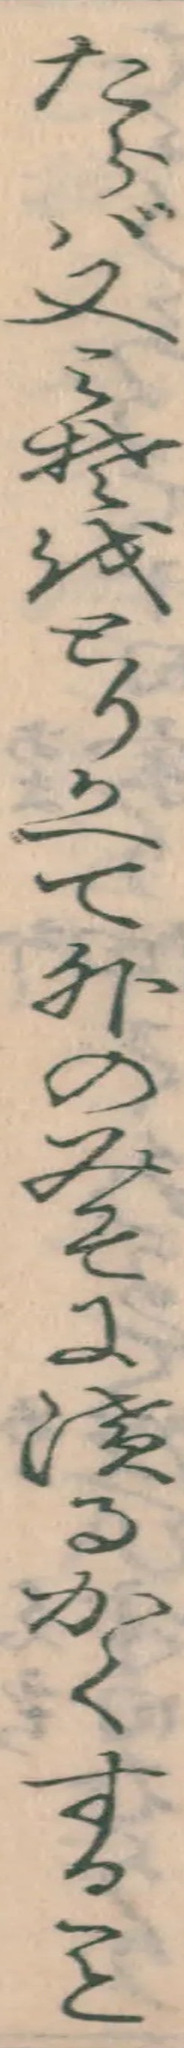たらば又みそをとりかへて外のみそに漬るかくすること
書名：四季漬物鹽嘉言
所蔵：国立国会図書館 National Diet Library, JAPAN
